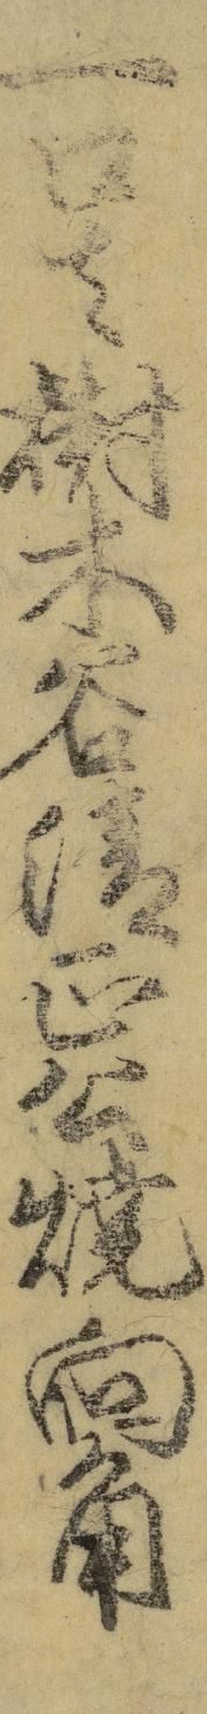一口は樹木谷清正公焼向角
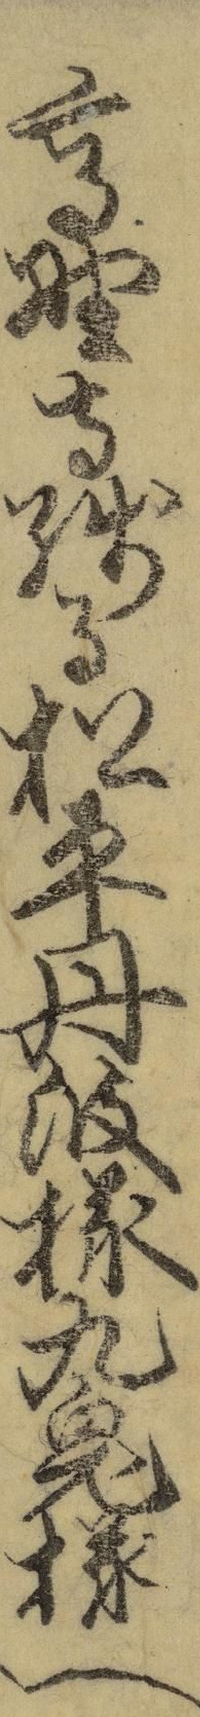高野寺残る松平丹波様九鬼様
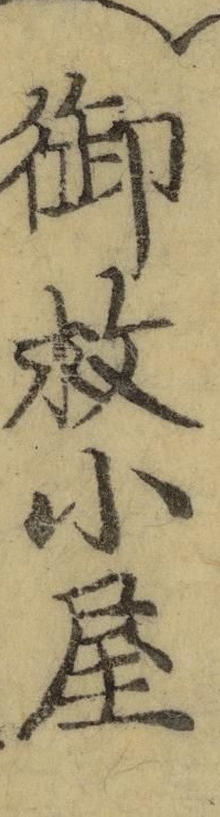御救小屋
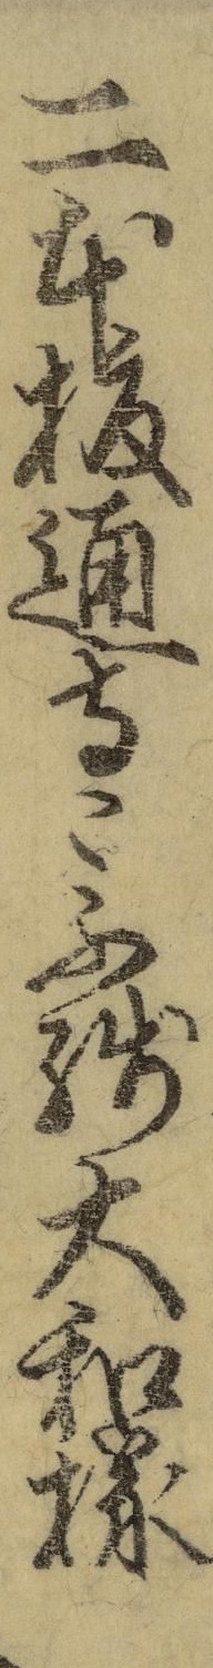二本抜通寺〻不残大和様
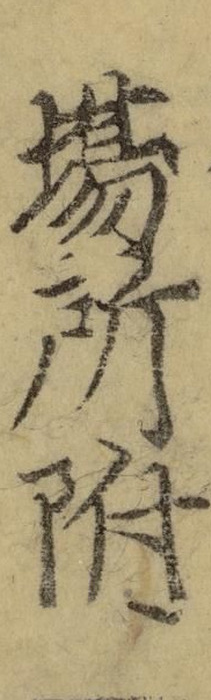場所附
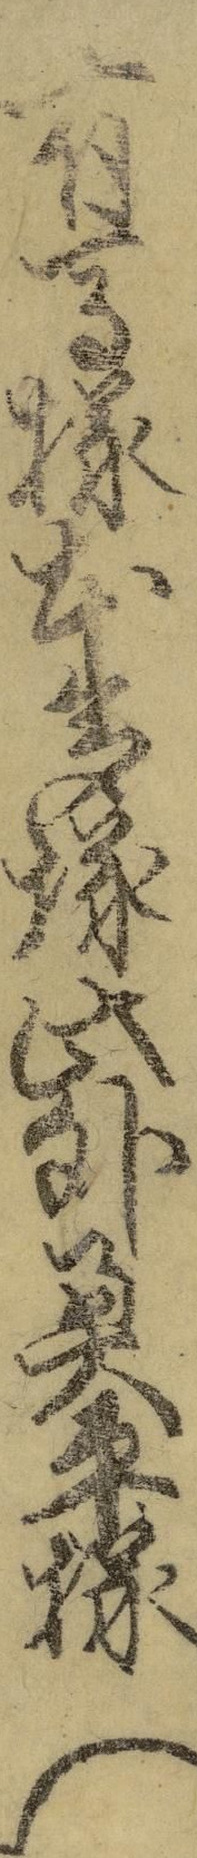有馬様本生様此外奥平様
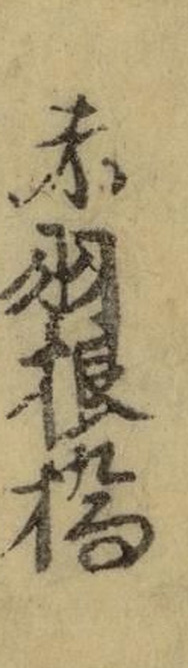赤羽根橋
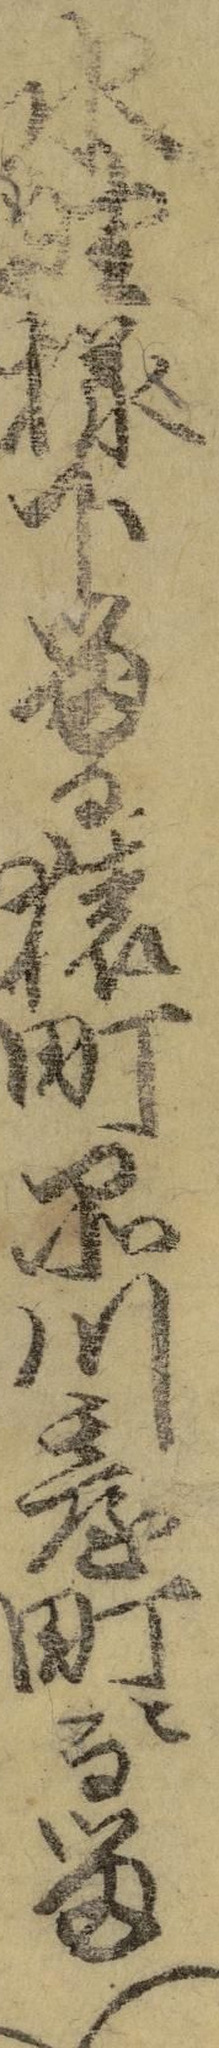水野様下留る猿町品川台町而留
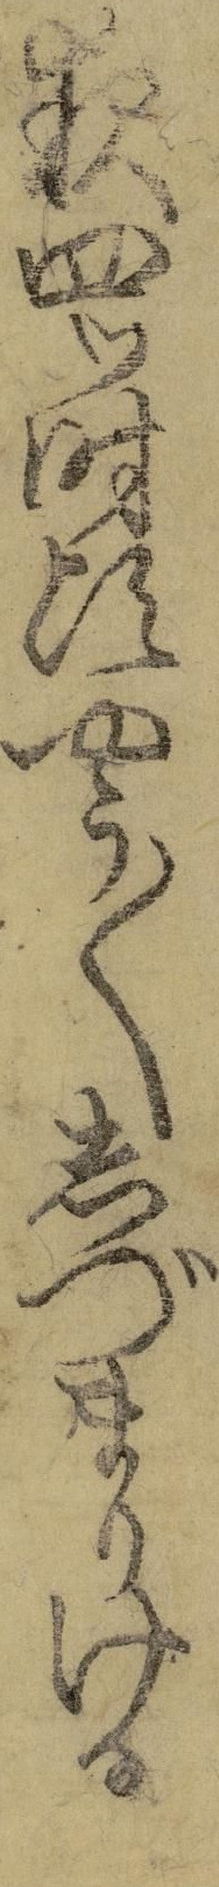夜四ツ時頃やう〳〵しづまりける
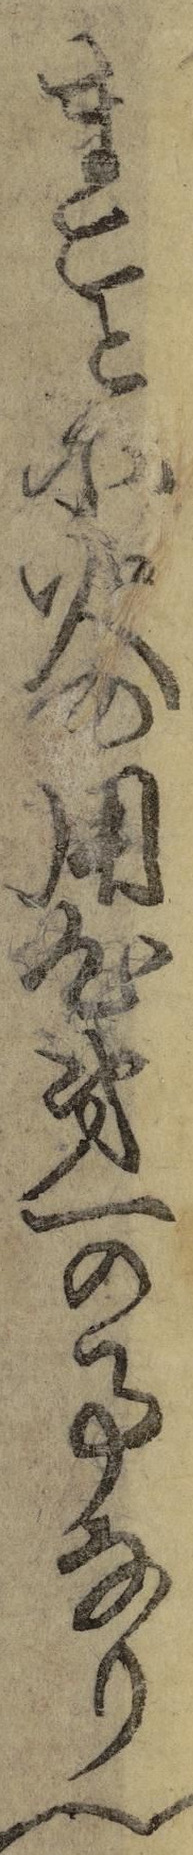まことに火の用心第一の事なり
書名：[弘化二年正月の江戸大火に関する瓦版]
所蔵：東京大学地震研究所図書室 Earthquake Research Institute Library, The University of Tokyo, JAPAN
